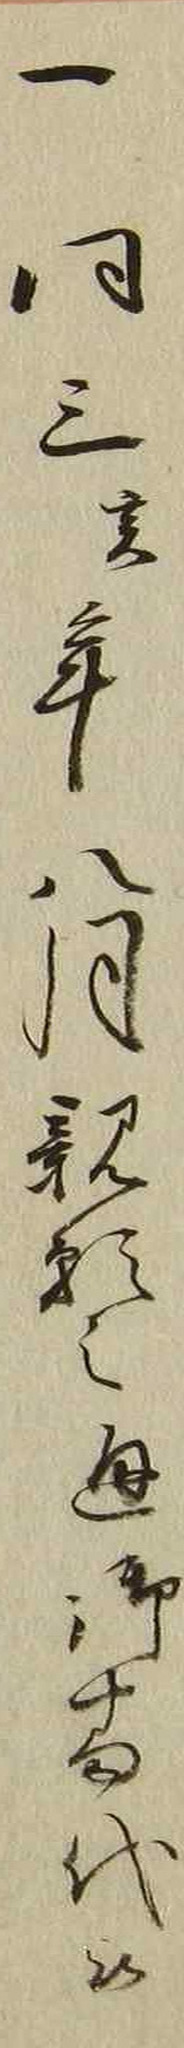一同三亥年八月親願之通御番代被
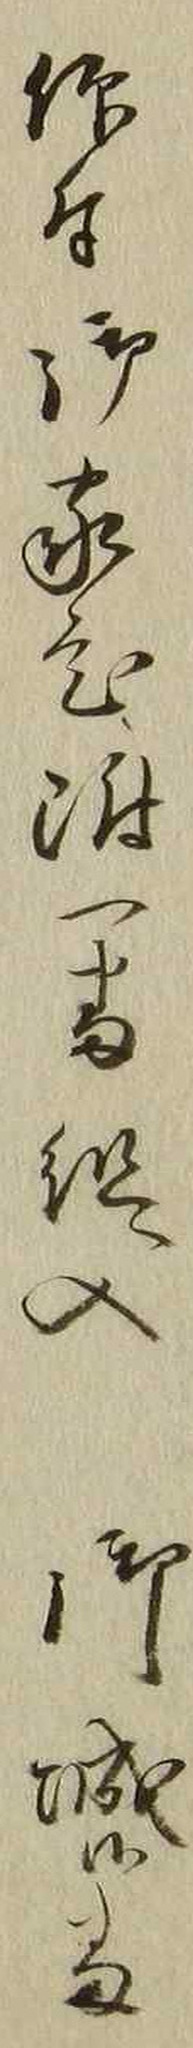仰付御家老附一番組ヘ入御城御番
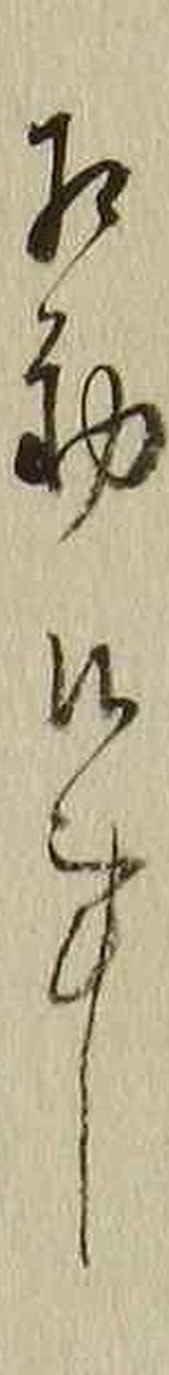相勤候事
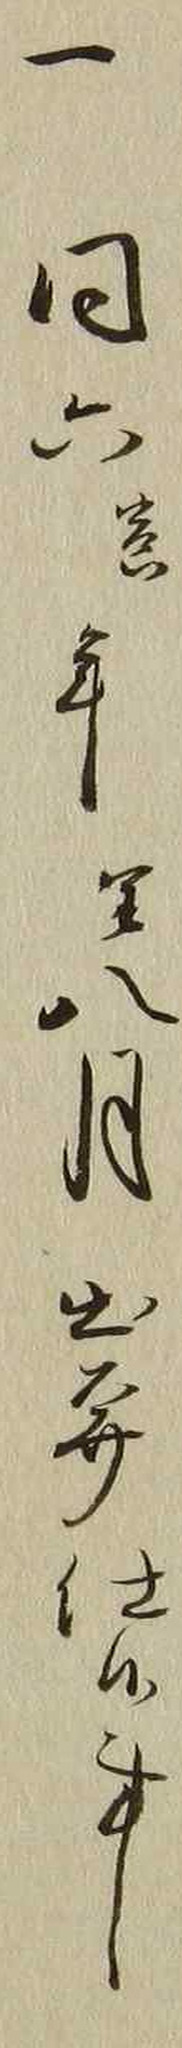一同六寅年閏八月出奔仕候事
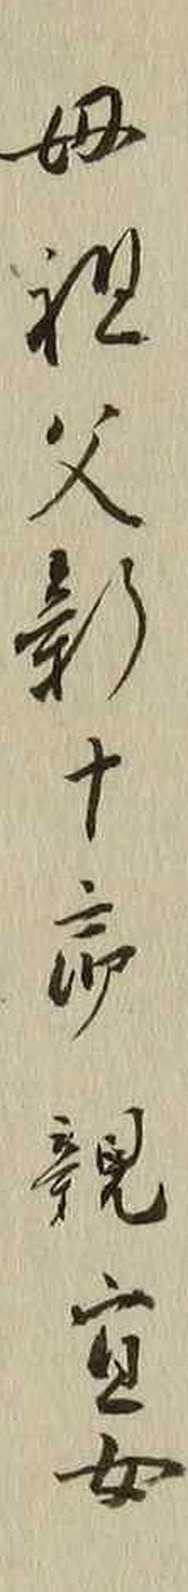母祖父新十郎親宜女
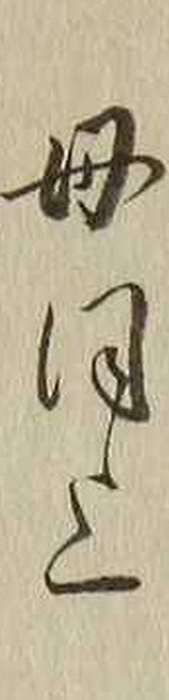母同上
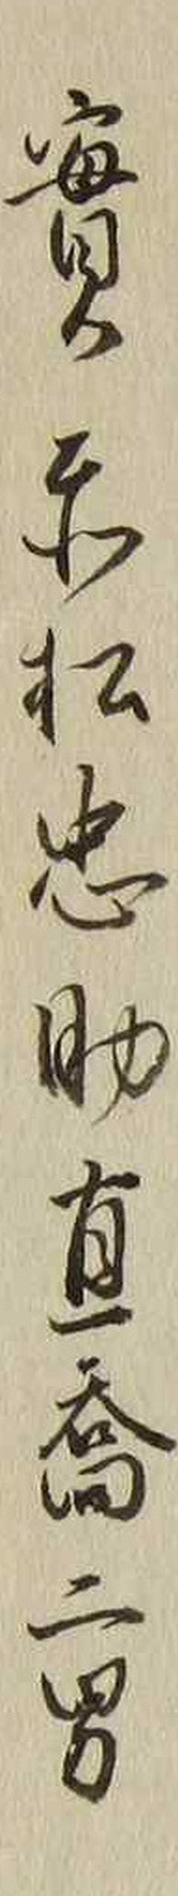実赤松忠助直喬二男
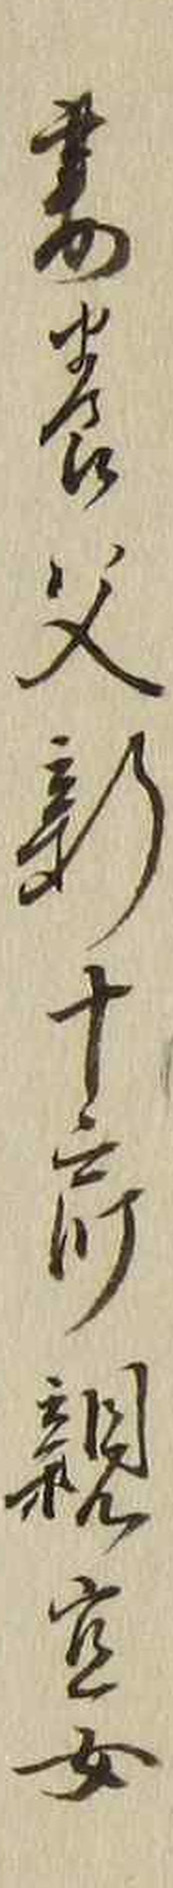妻養父新十郎親宜女

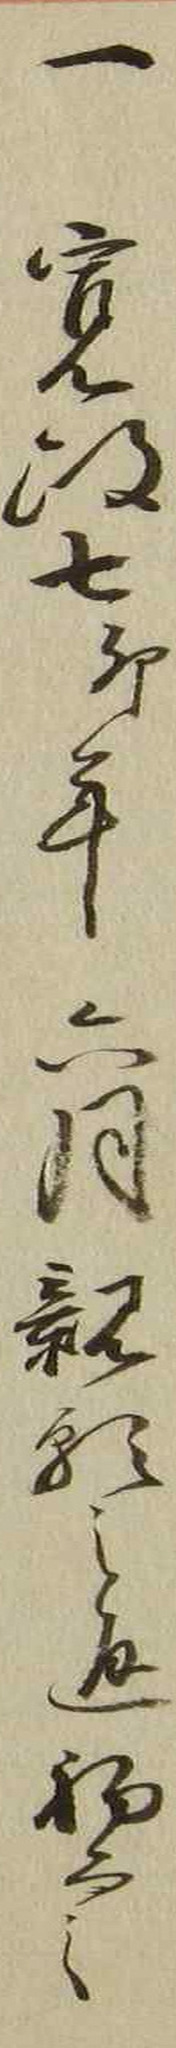一寛政七卯年六月親願之通初而之
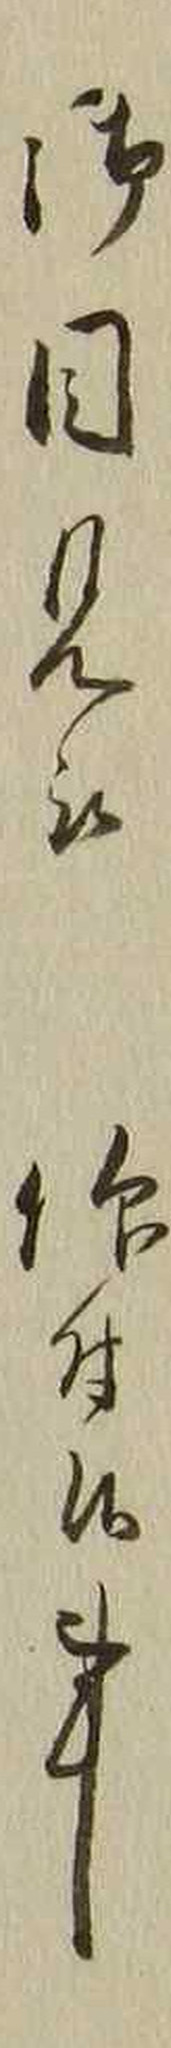御目見被仰付候事
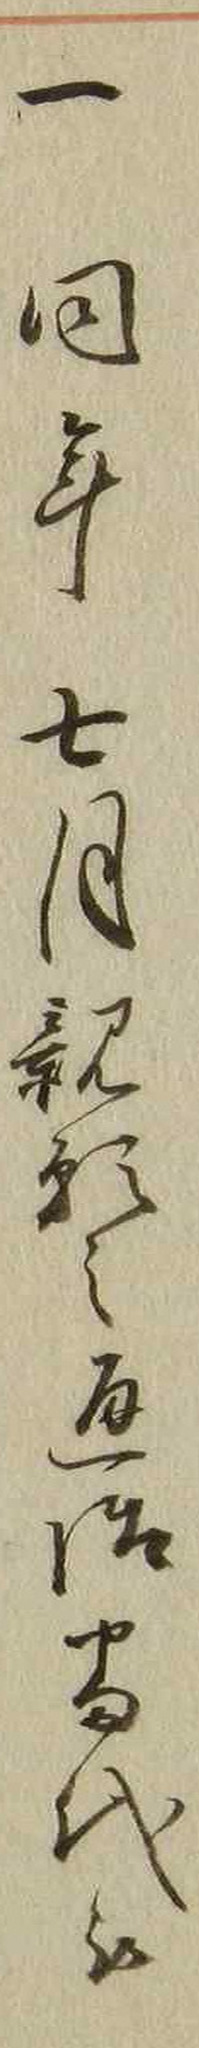一同年七月親願之通御番代被
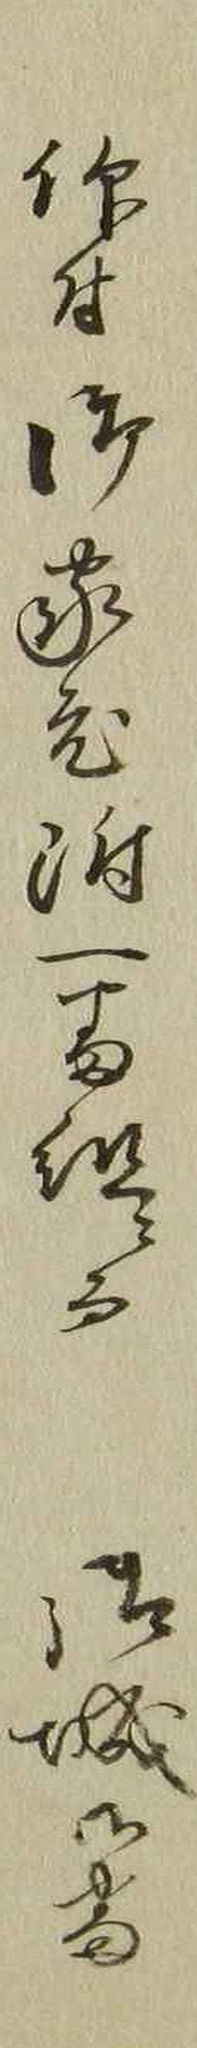仰付御家老附一番組ニ而御城御番
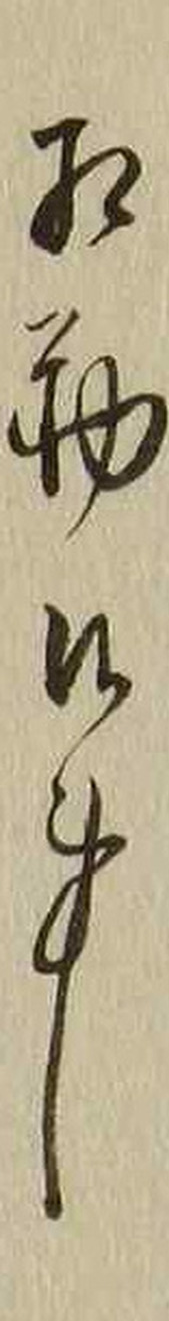相勤候事
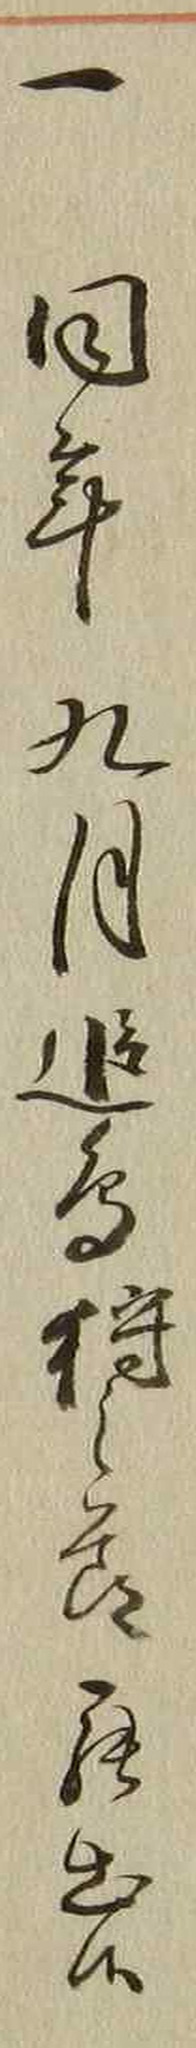一同年九月追鳥狩之節罷出候
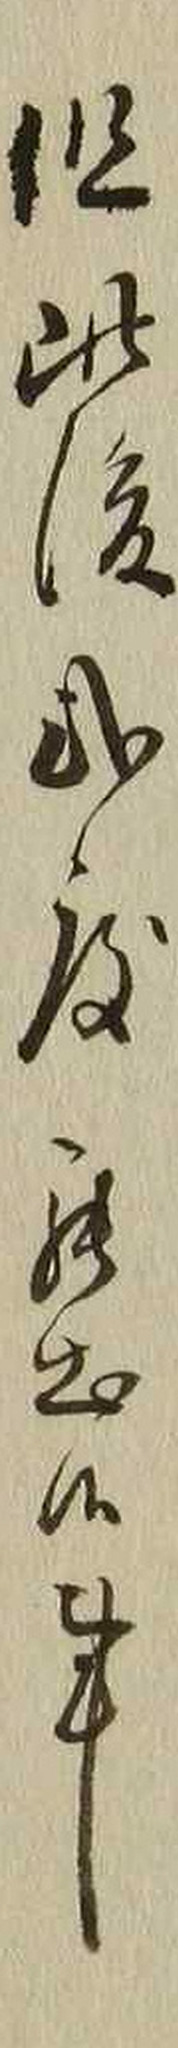但此後弐度罷出候事
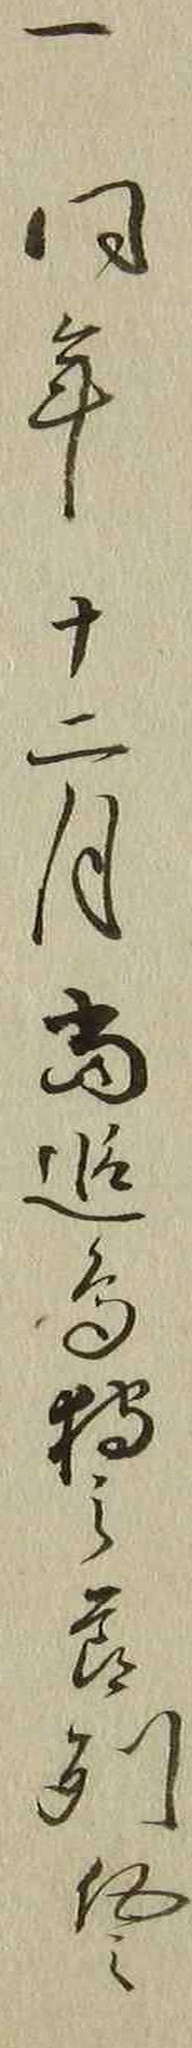一同年十一月当追鳥狩之節列伍之
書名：諸士系譜　巻之68　を之部2
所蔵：会津若松市立会津図書館
